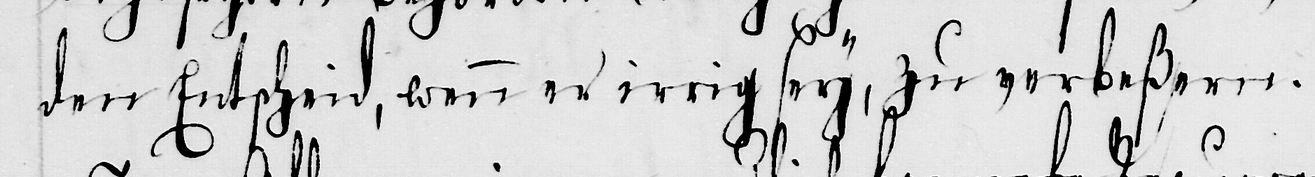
den Entscheid, wenn er irrig sey, zu verbeßern.
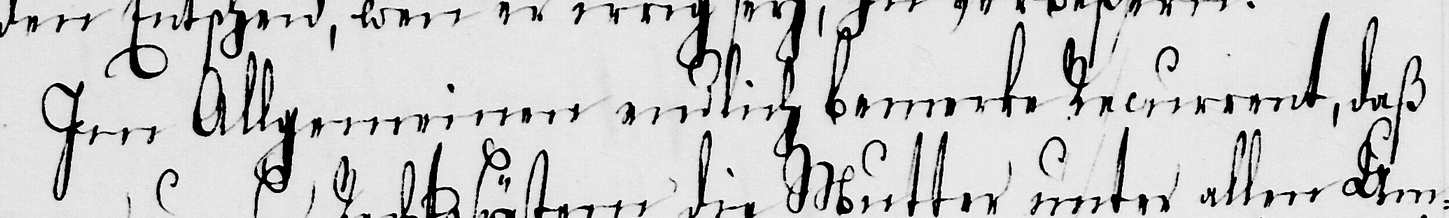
Im Allgemeinen endlich bemerke Recurrent, daß
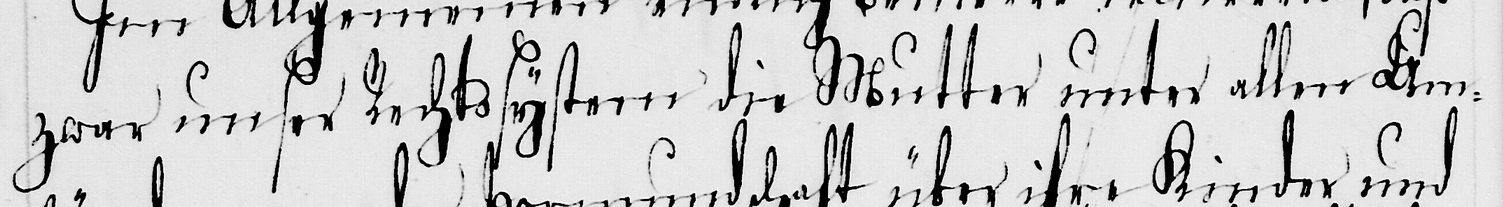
zwar unser Rechtssystem die Mutter unter allen Um¬
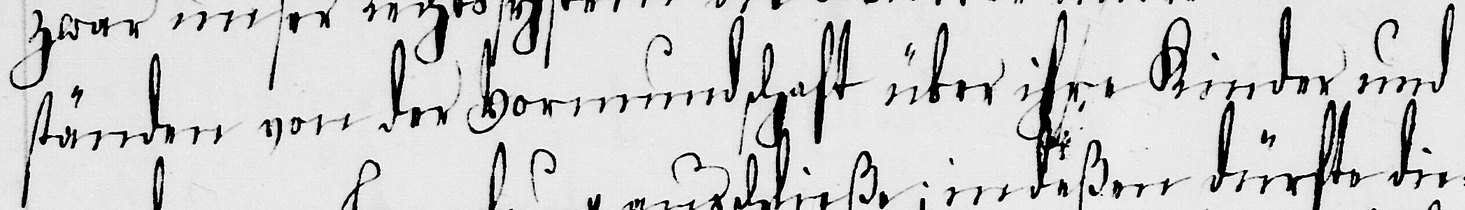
ständen von der Vormundschaft über ihre Kinder und
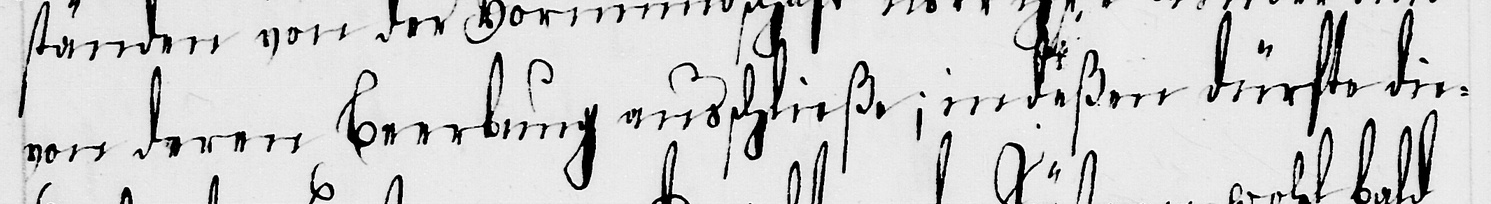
von deren Beerbung ausschließe, indeßen dürfte die¬
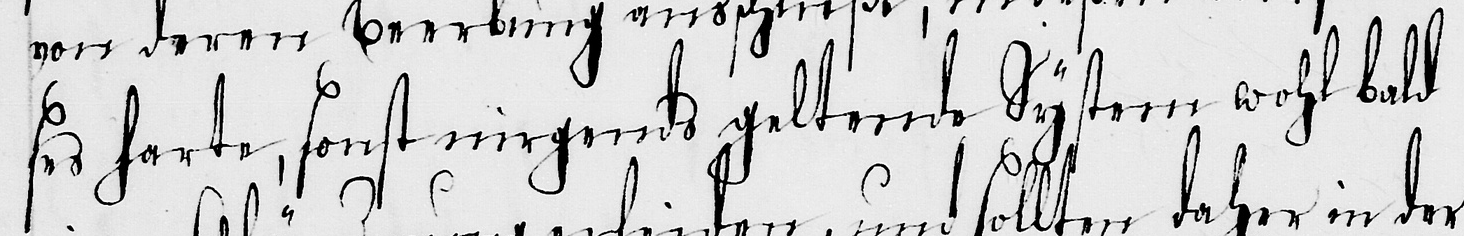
ses harte, sonst nirgends geltende System wohl bald
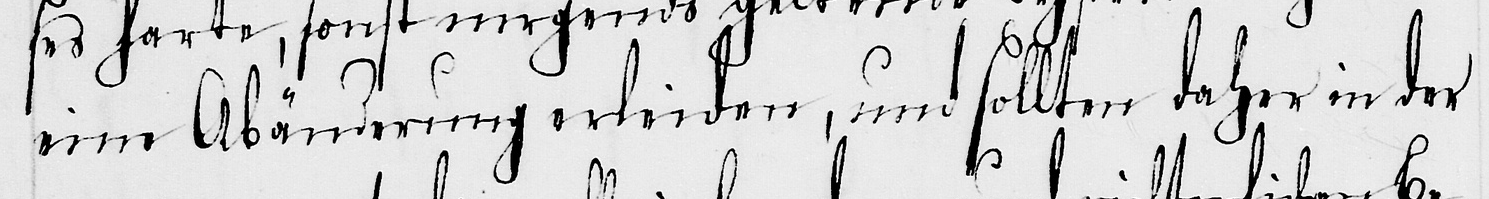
eine Abänderung erleiden, und sollten daher in der
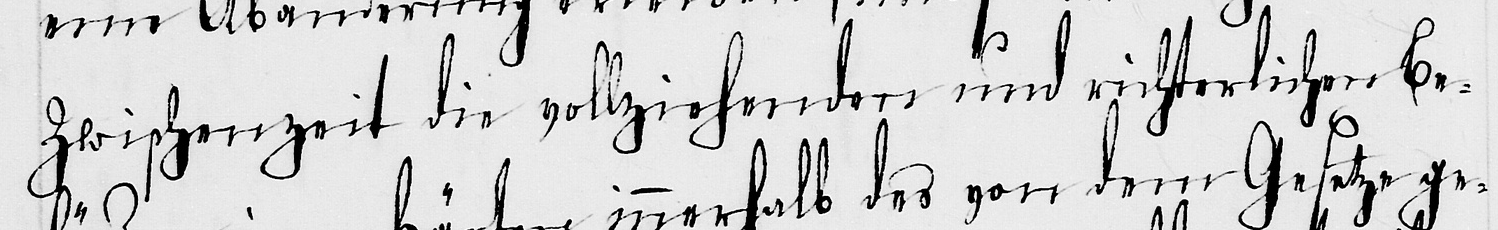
Zwischenzeit die vollziehenden und richterlichen Be¬
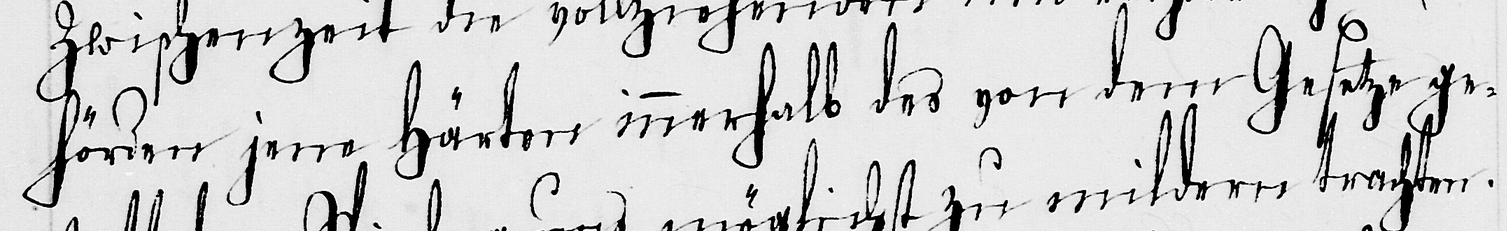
hörden jene Härten innerhalb des von dem Gesetze ge¬
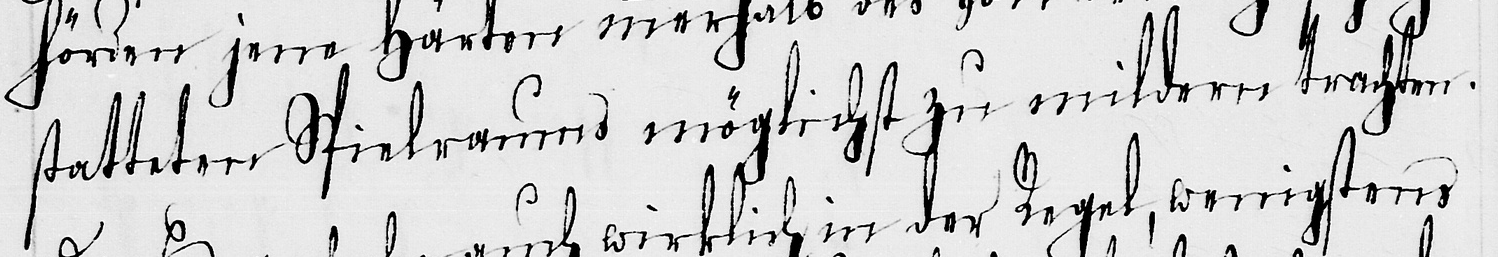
statteten Spielraums möglichst zu mildern trachten.
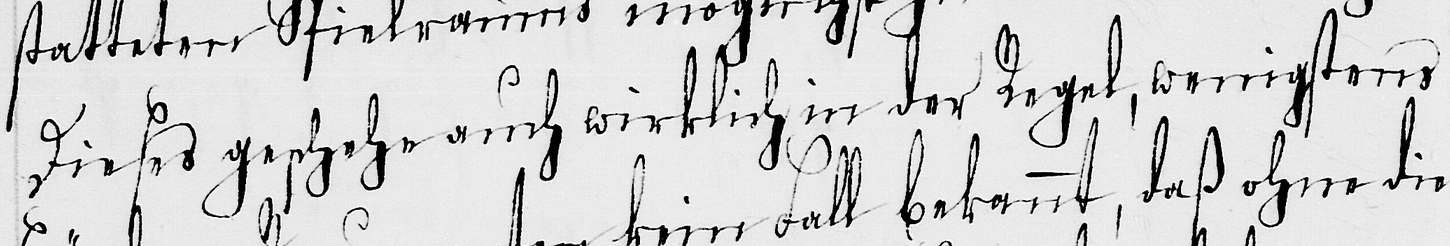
Dieses geschehe auch wirklich in der Regel, wenigstens
